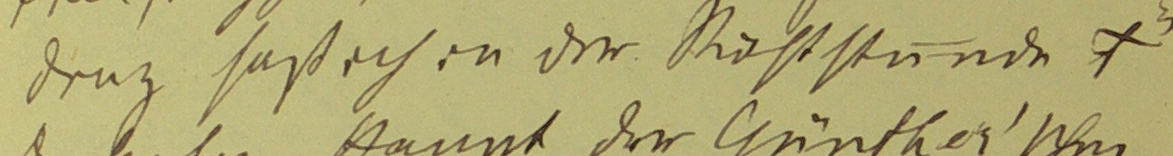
denz saß ich in der Neststunde mit
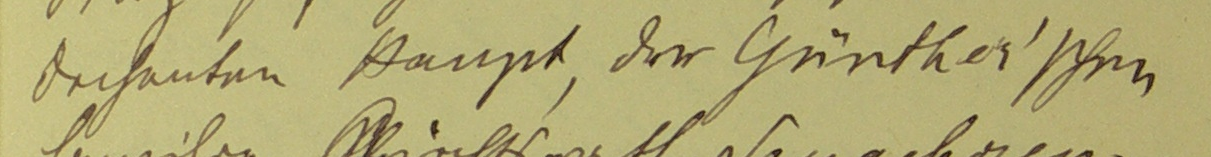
Dechanten Haupt der Günthters’che
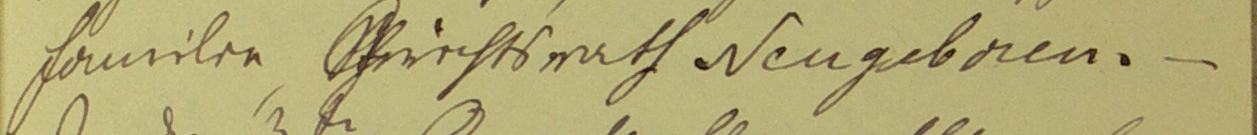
Familien, Gerichtsrath Neugeboren.-
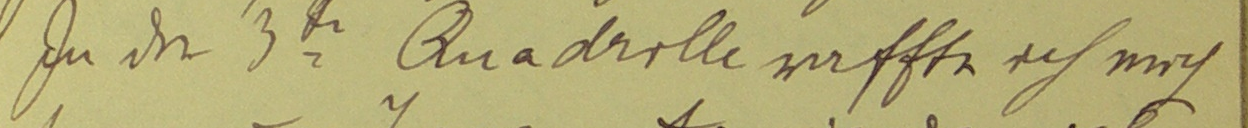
In der 3-ten Quadrille raffte ich mich
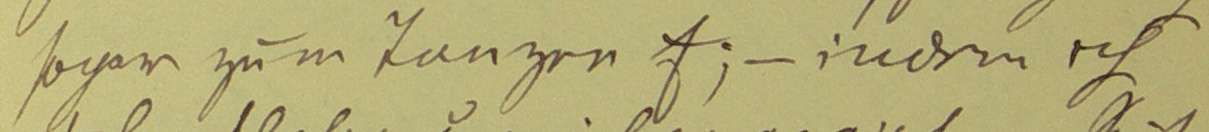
sogar zum Tanzen auf;- indem ich
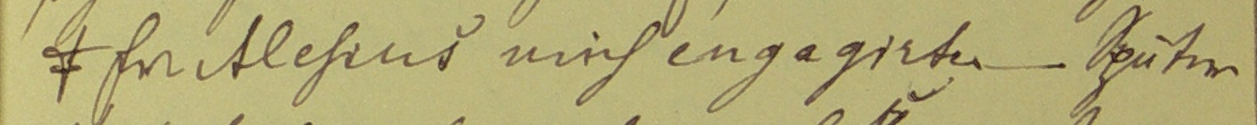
mit Fr. Alesius mich engagierte. Später
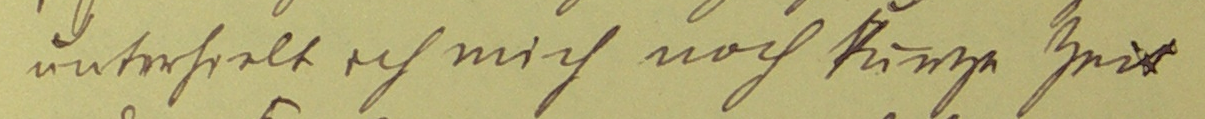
unterhielt ich mich noch kurze Zeit
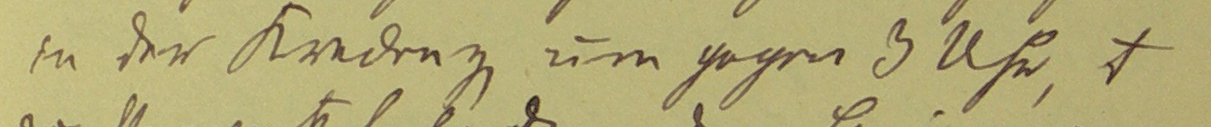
in der Kredenz um gegen 3 Uhr, mit
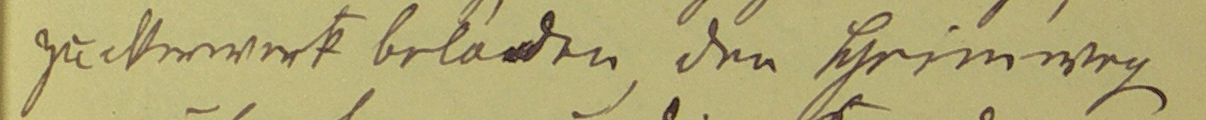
Zuckerwerk beladen, den Heimweg
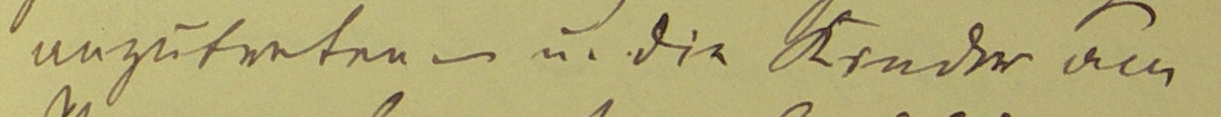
anzutreten- und die Kinder am
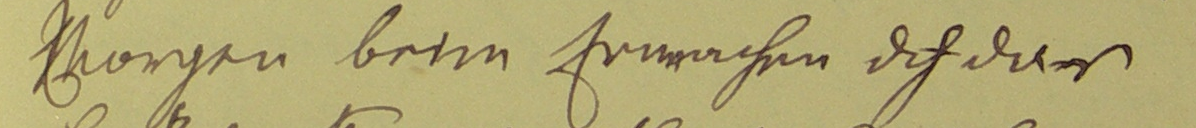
Morgen beim Erwachen mit diesem
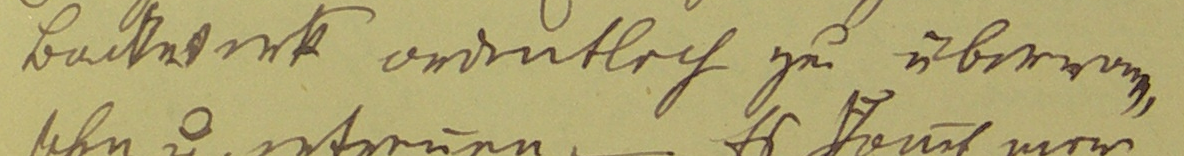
Backwerk ordentlich zu überra¬
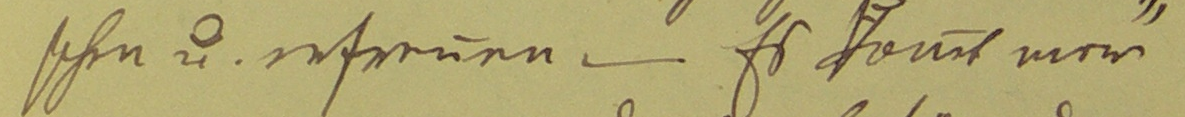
schen und erfreuen,- Es kommt nur
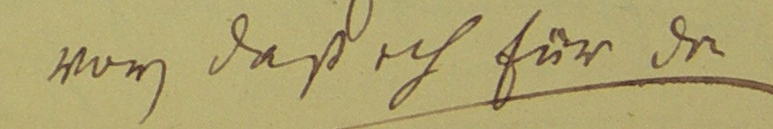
vor daß ich für die
